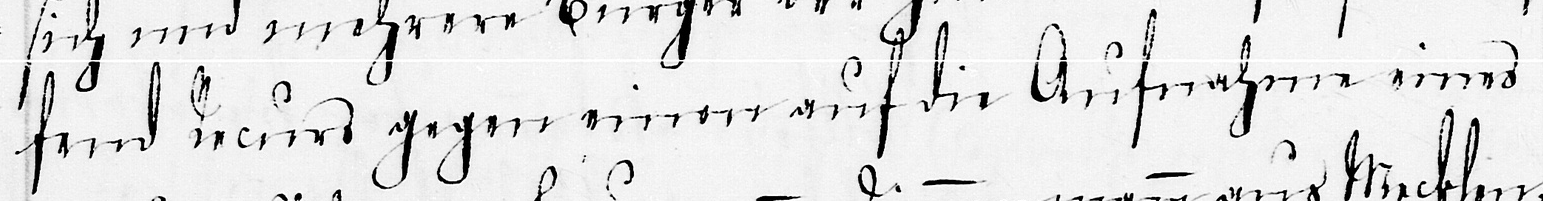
fend Recurs gegen einen auf die Aufnahme eines
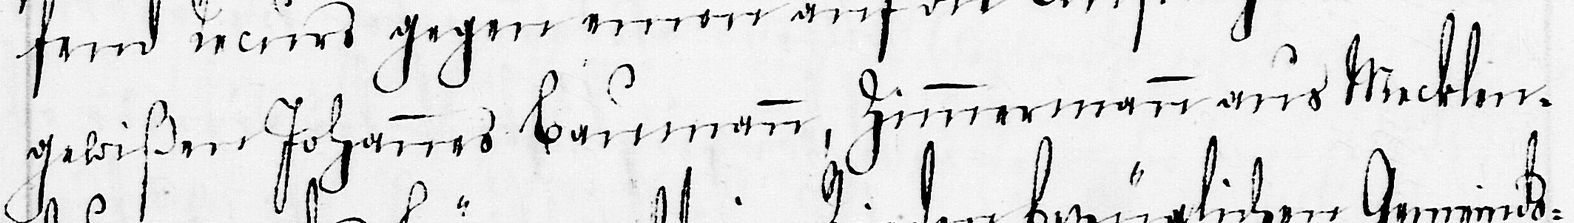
gewißen Johannes Baumann, Zimmermann aus Mecklen¬
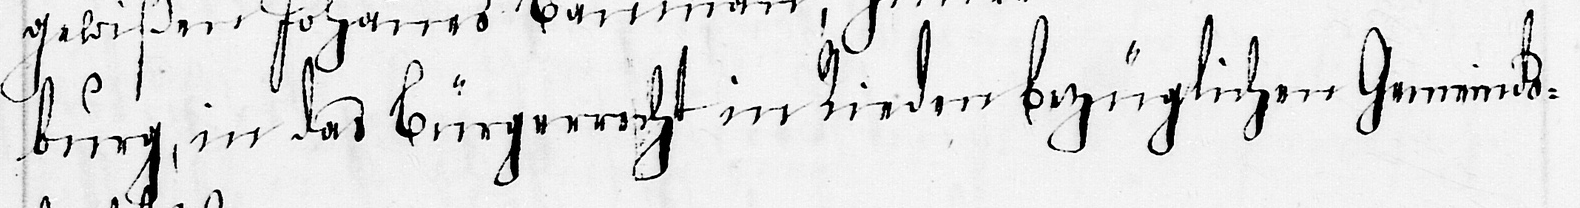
burg, in das Bürgerrecht in Rieden bezüglichen Gemeinds¬
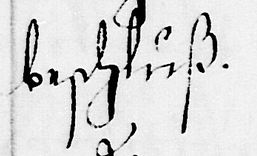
beschluß.
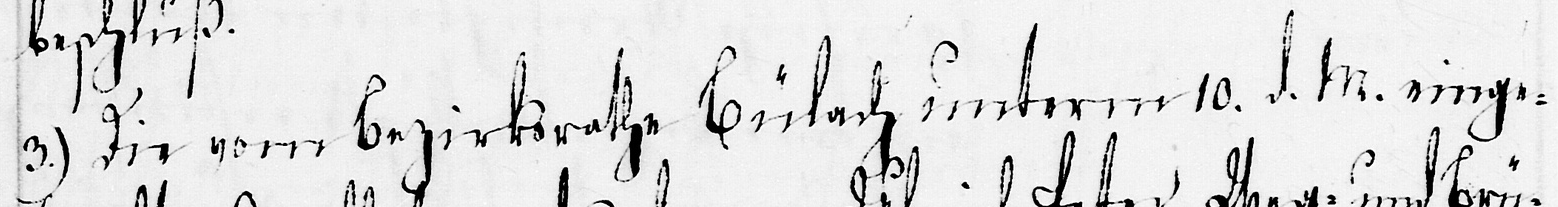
3.) Die vom Bezirksrathe Bülach unterm 10. d. M. einge¬
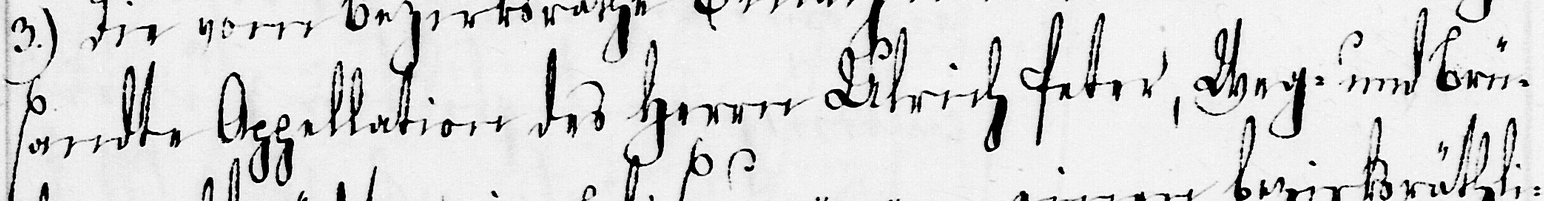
sandte Appellation des Herrn Ulrich Peter, Weg- und Brü¬
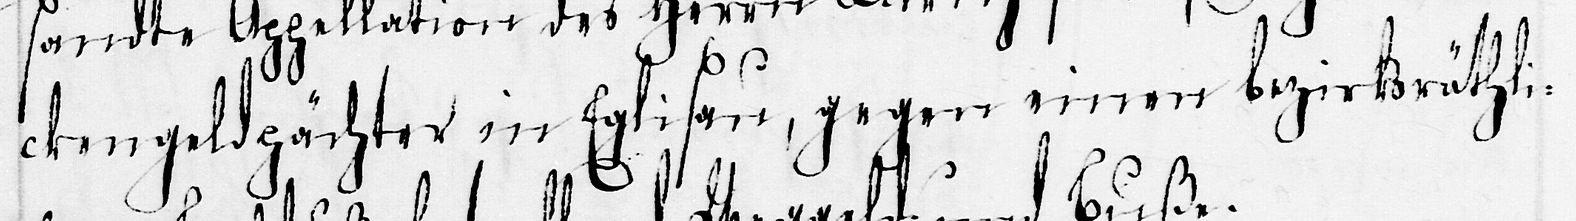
ckengeldpächter in Eglisau, gegen einen bezirksräthli¬
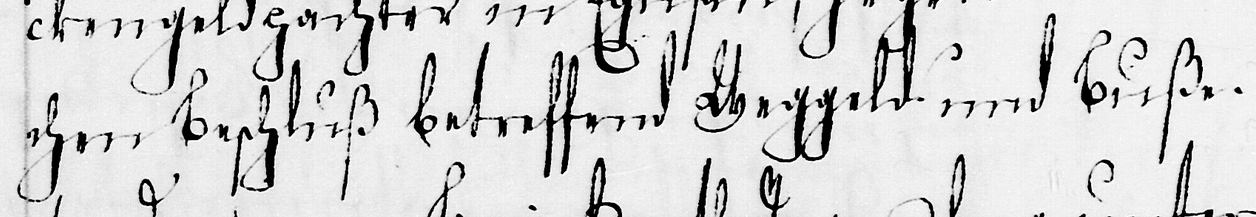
chen Beschluß betreffend Weggeld und Buße.
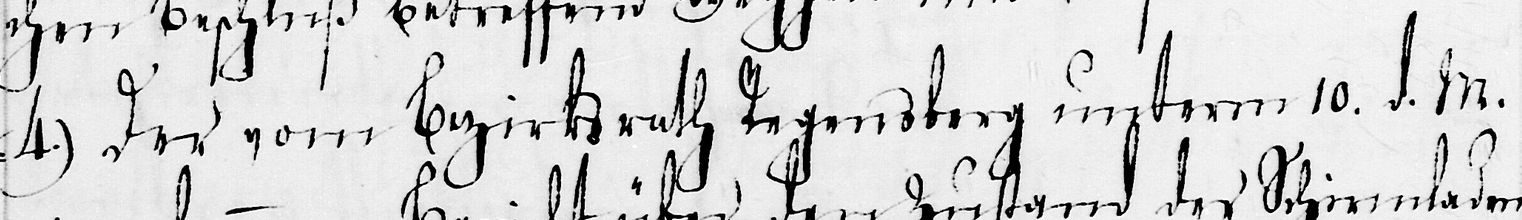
4.) Der vom Bezirksrath Regensberg unterm 10. d. M.
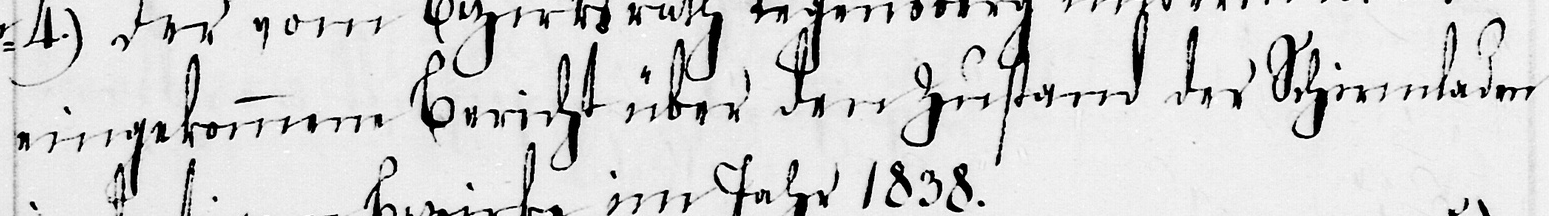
eingekommene Bericht über den Zustand der Schirmladen
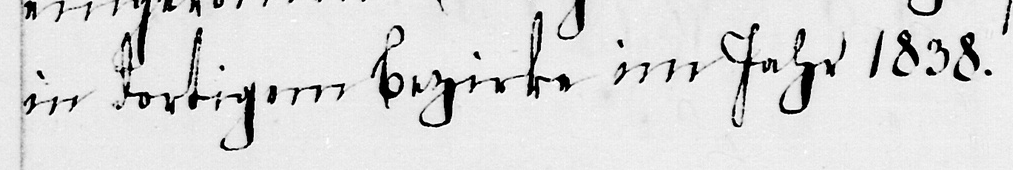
in dortigem Bezirke im Jahr 1838.
